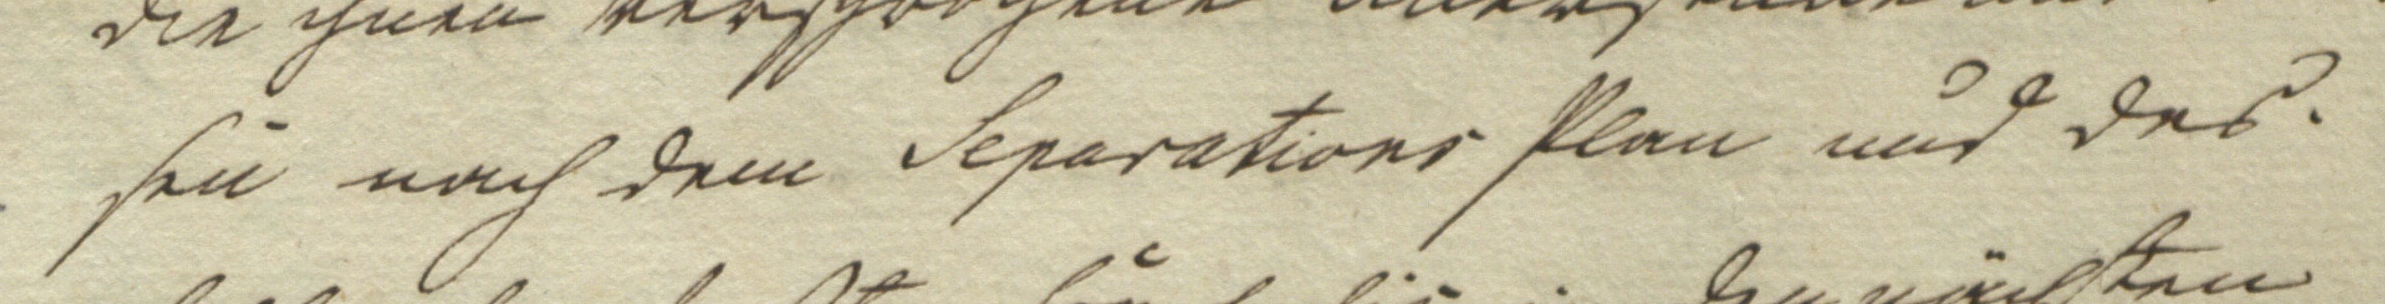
sen nach dem Separations Plan und des¬
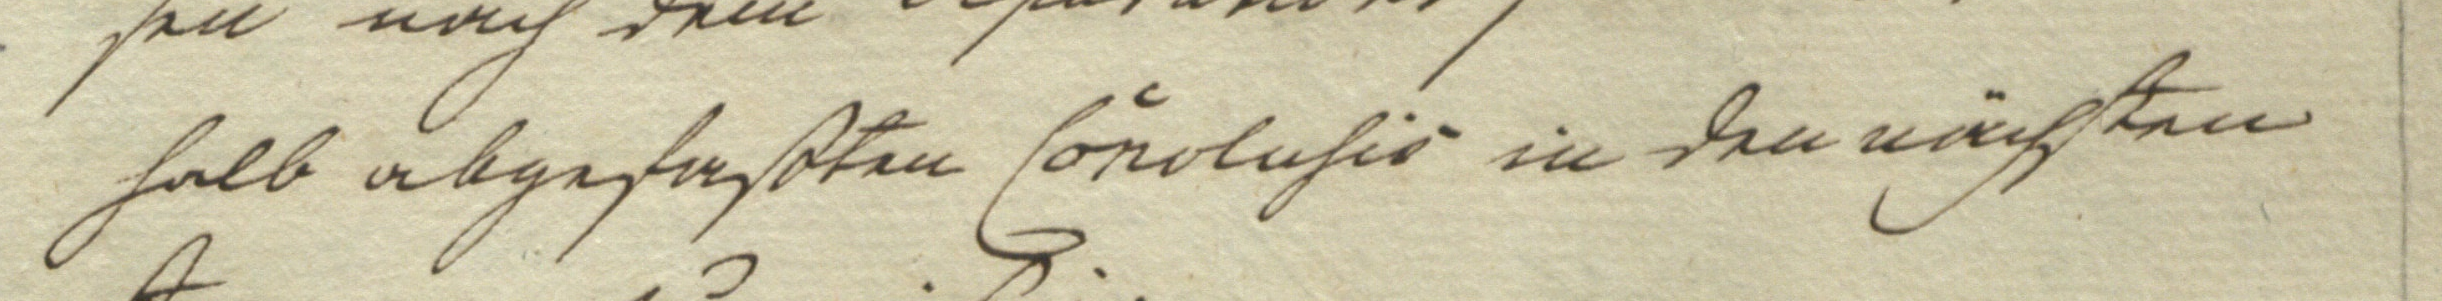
halb abgefaßten Conclusis in den nächsten
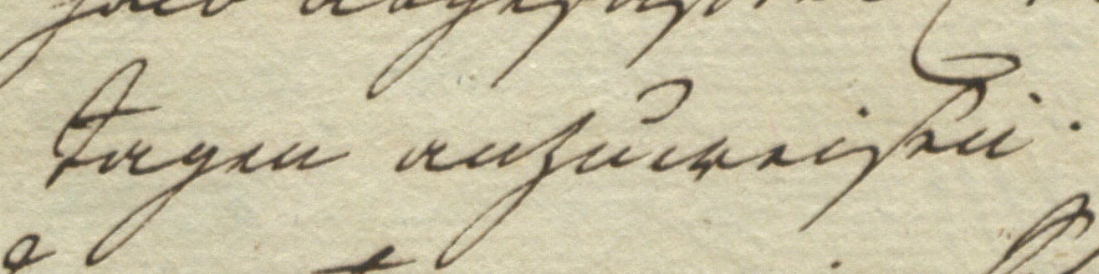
Tagen anzuweisen.
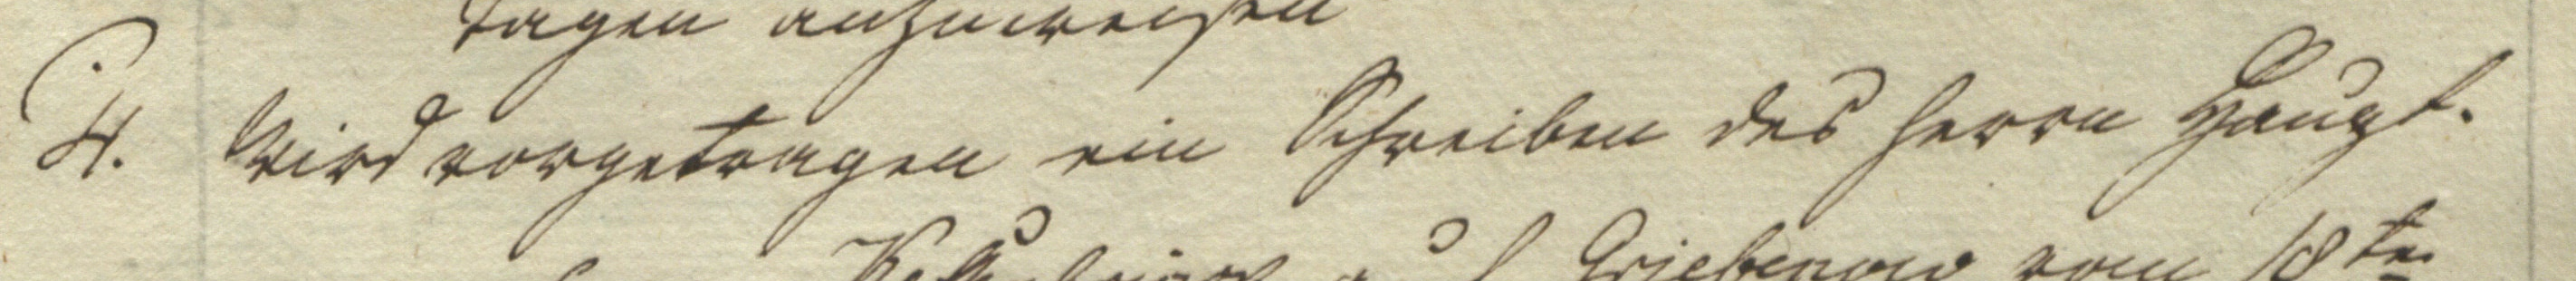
4. Wird vorgetragen ein Schreiben des Herrn Haupt¬
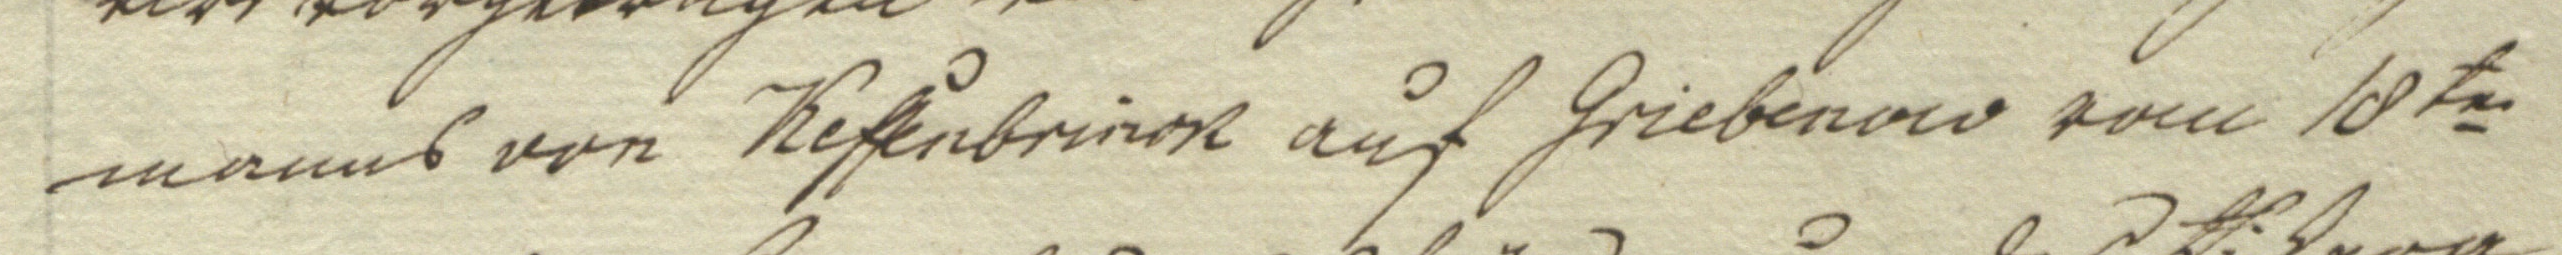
manns von Keffenbrinck auf Griebenow vom 18 ten
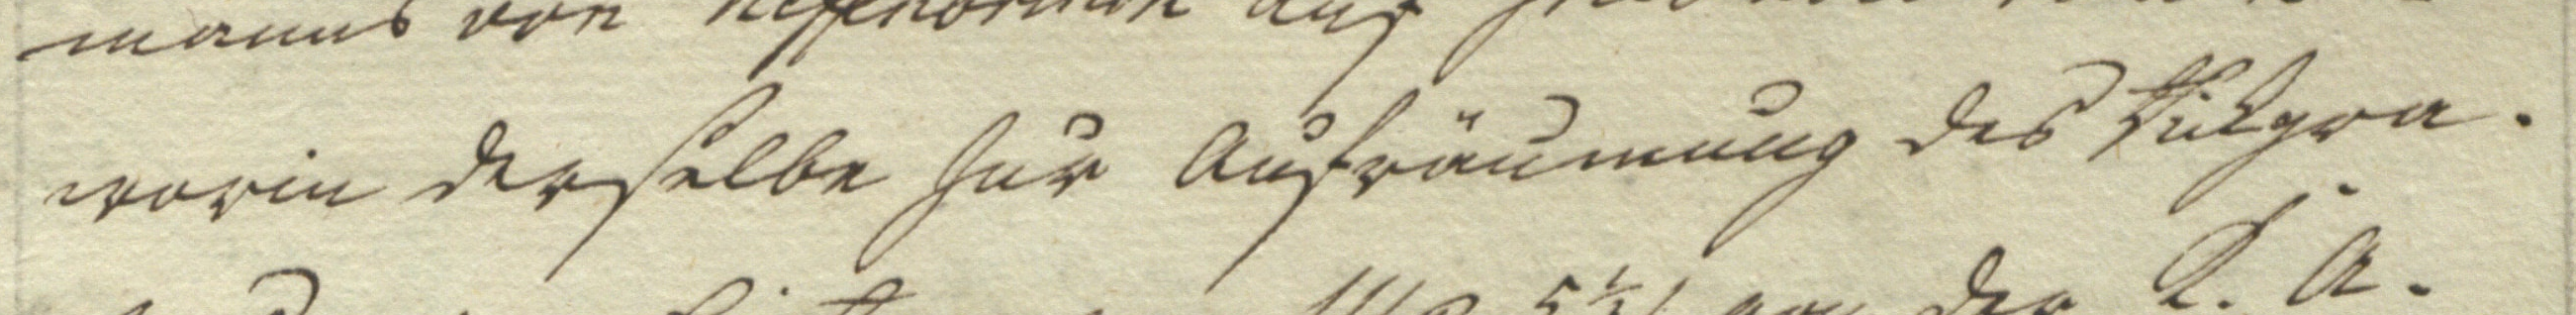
worin derselbe zur Aufräumung des Rückgra¬
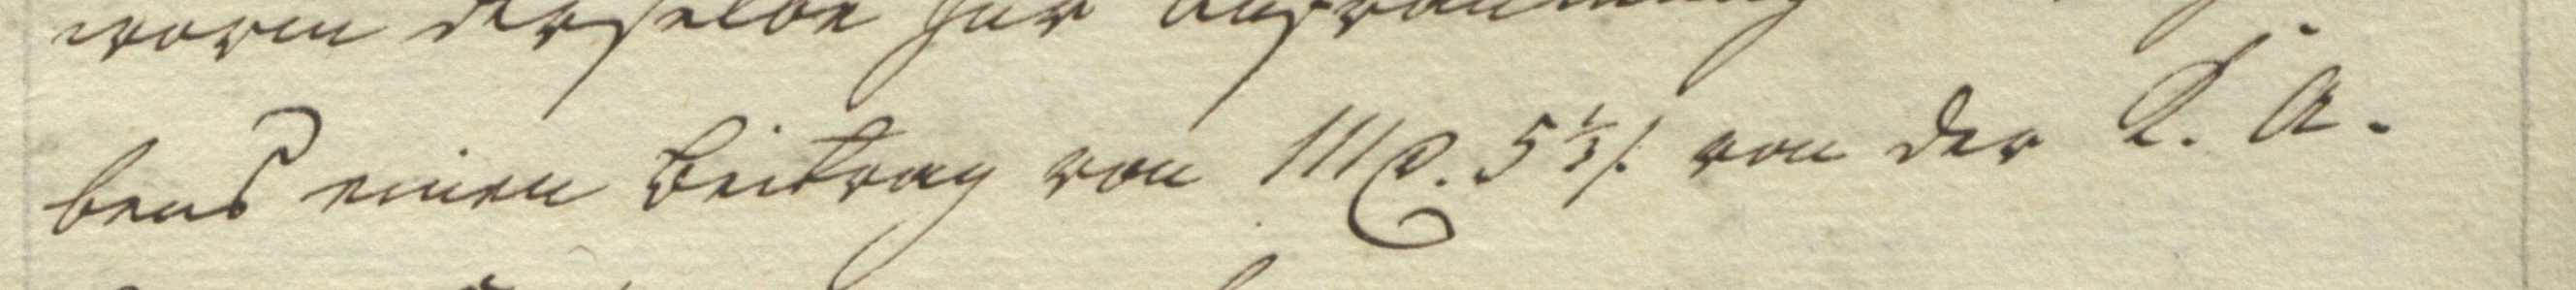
bens einen Beitrag von 111 l. 5 ½ s. von der K. A.
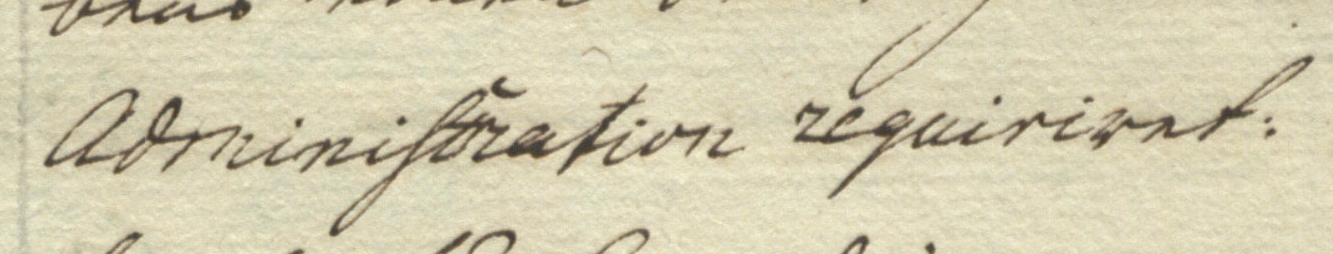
Administration requiriret.
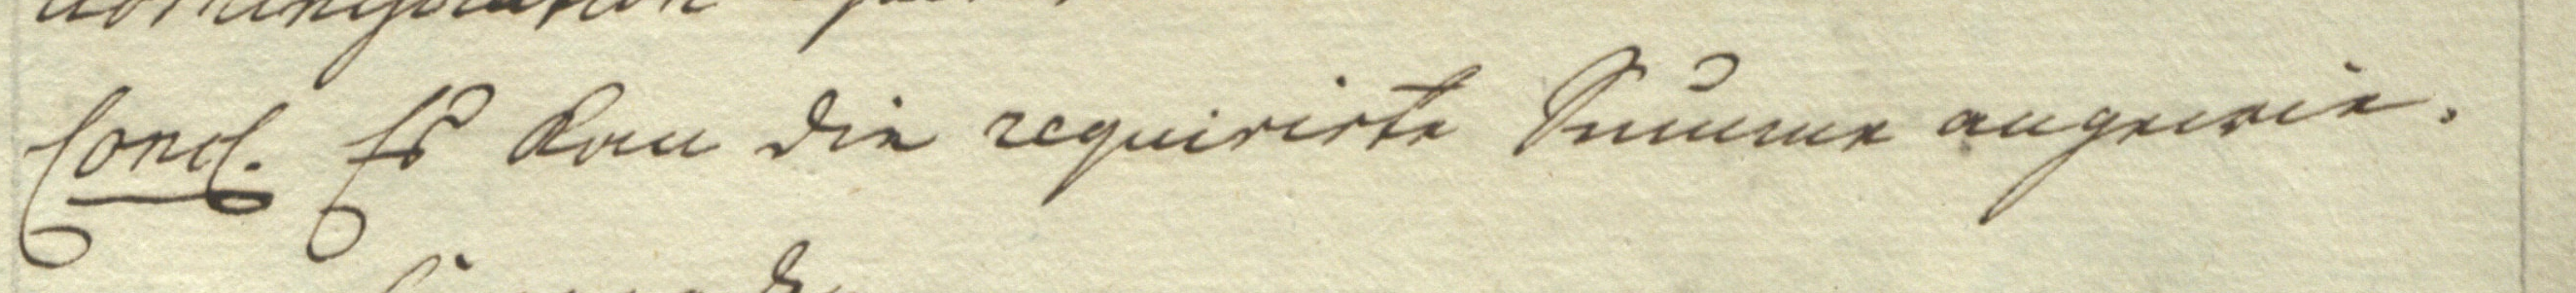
Concl. Es kan die requirirte Summe angewie¬
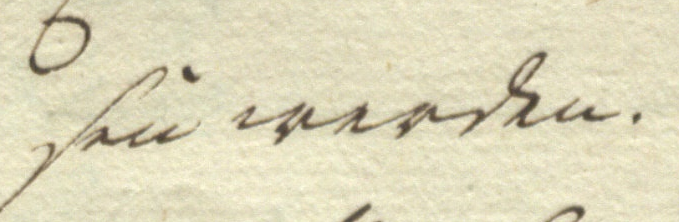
sen werden.
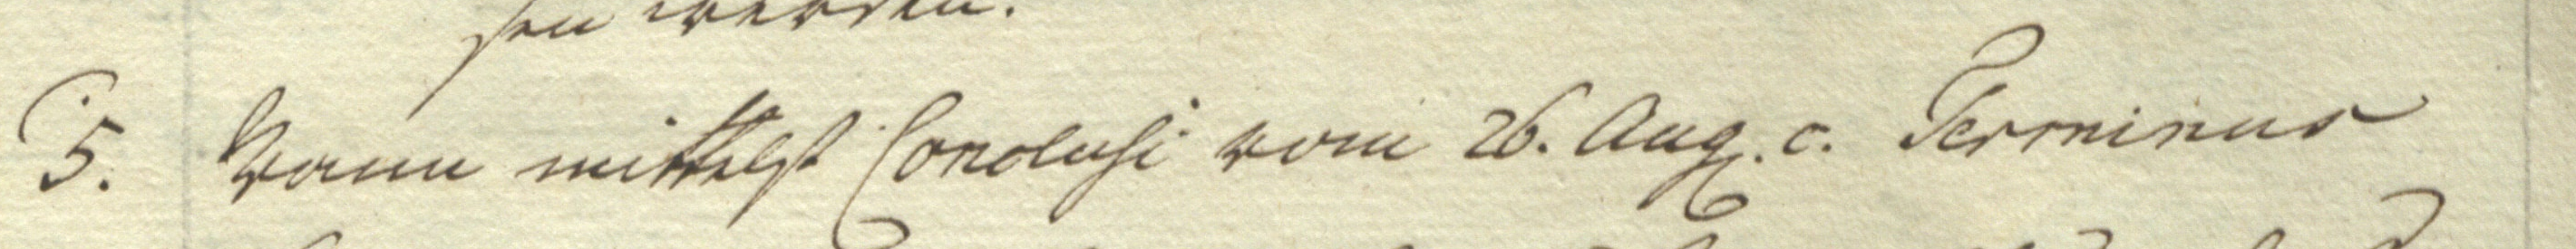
5. Wann mittelst Conclusi vom 26. Aug. c. Terminus
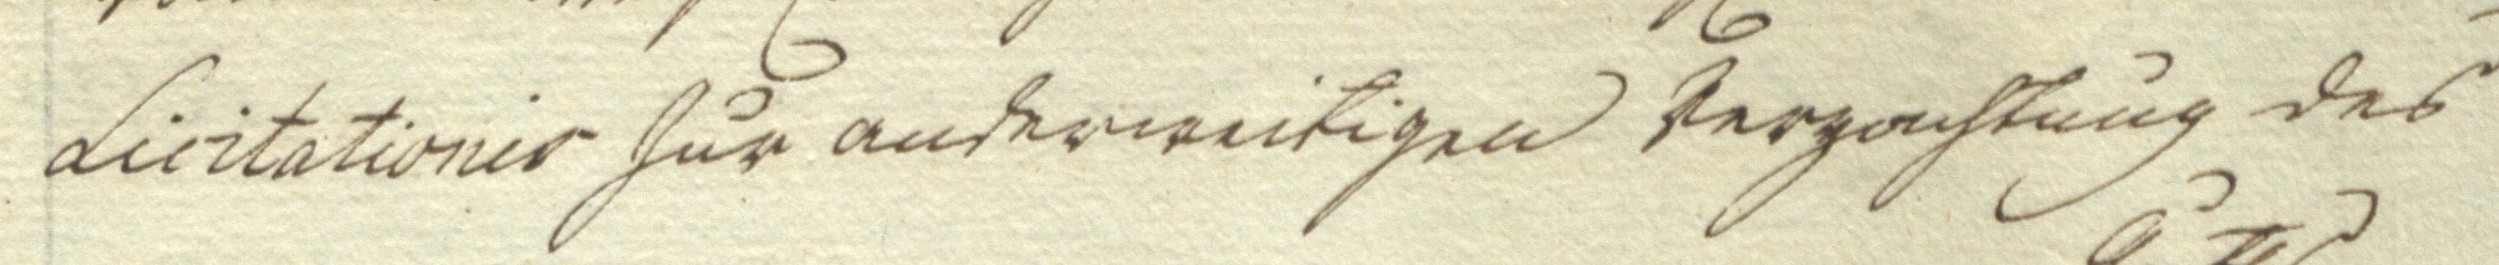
Licitationis zur anderweitigen Verpachtung des
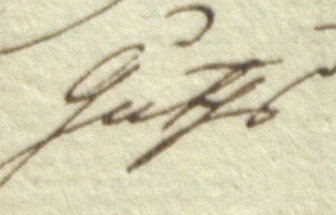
Guths
